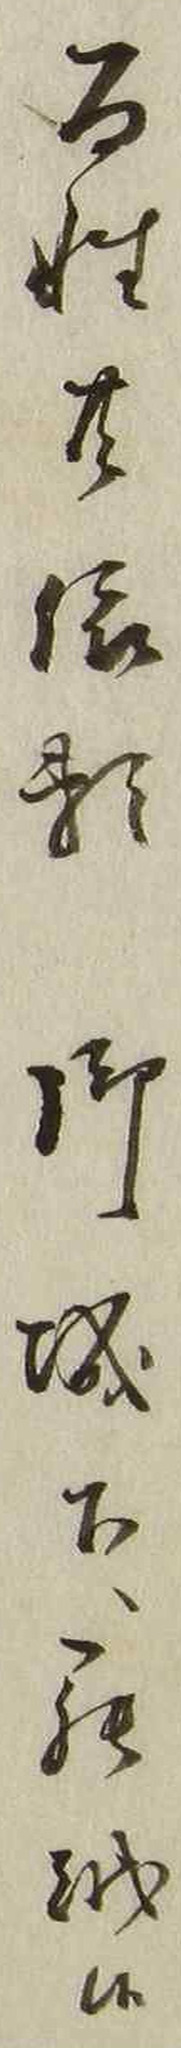百性共依願御城下へ罷越候
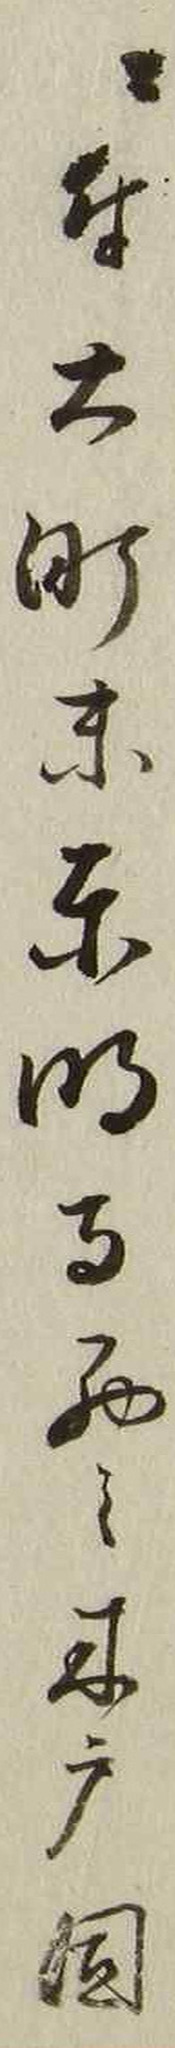に付大町未東明寺西之木戸固
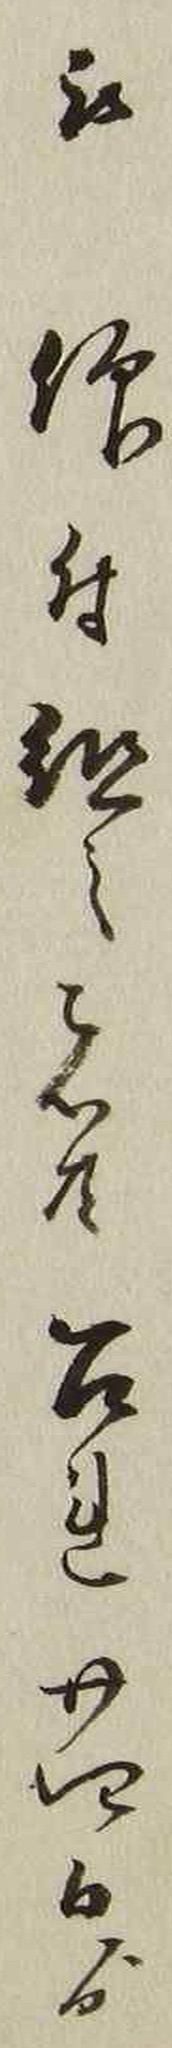被仰付組之物共召連廿四日ゟ
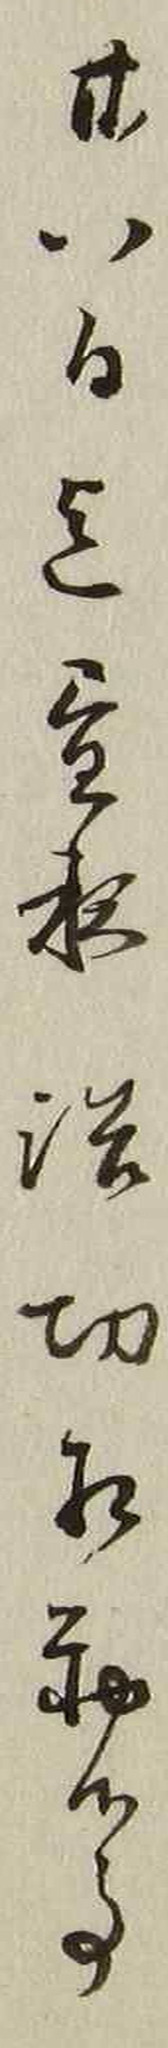廿八日迄昼夜詰功相勤候事
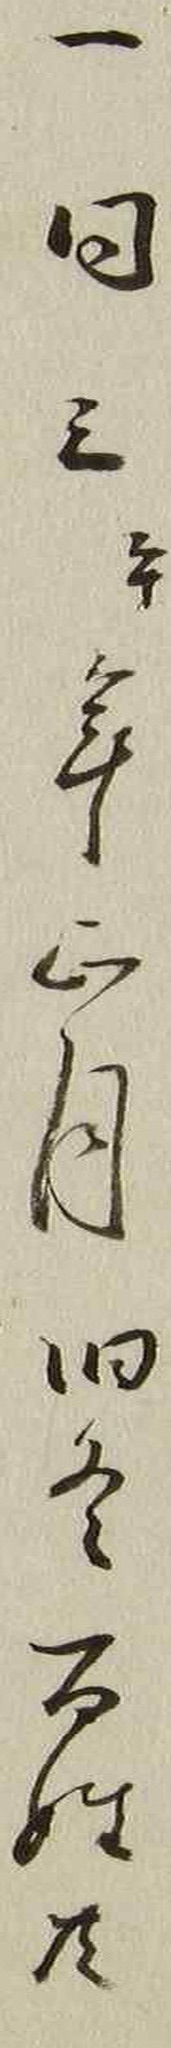一同三午年正月旧冬百姓共
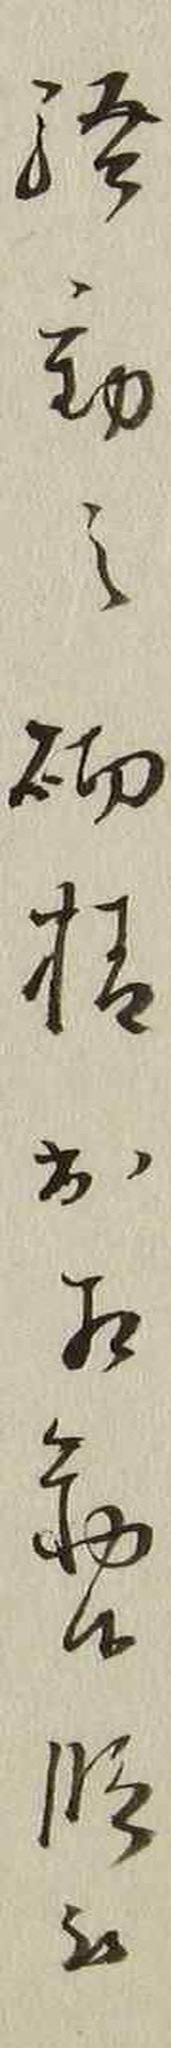騒動之砌精出相勤候段被
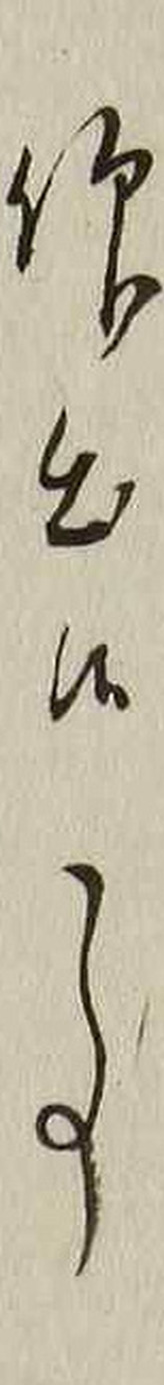仰出候事
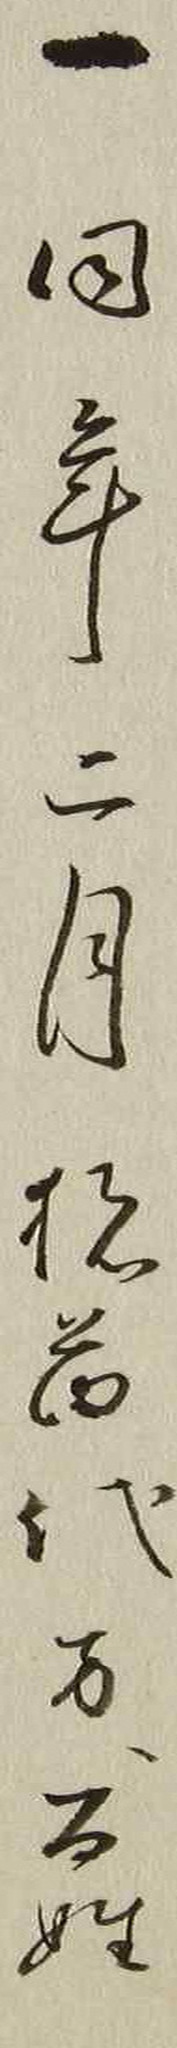一同年二月猪苗代方へ百姓
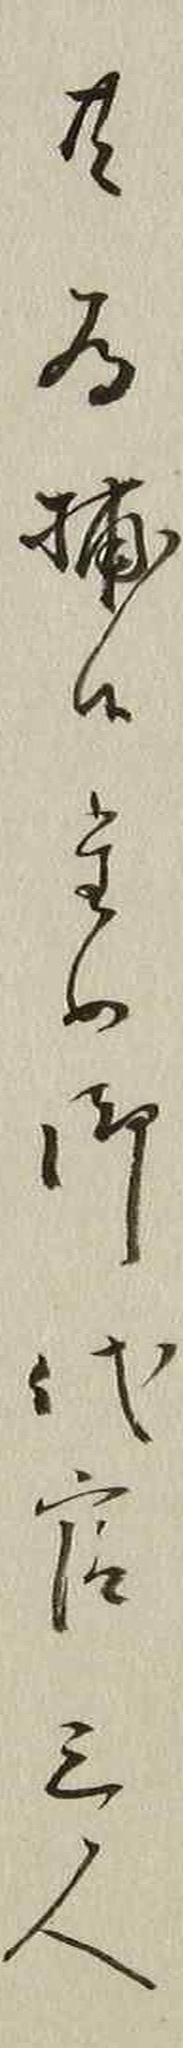共為捕候ため御代官三人
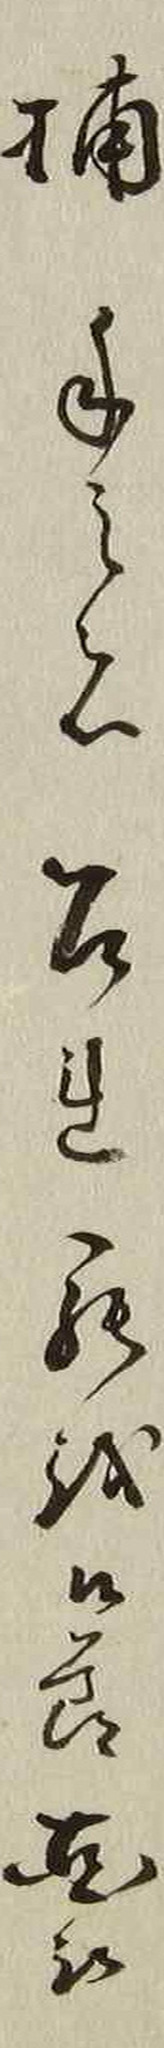捕手之者召連罷越御指図被
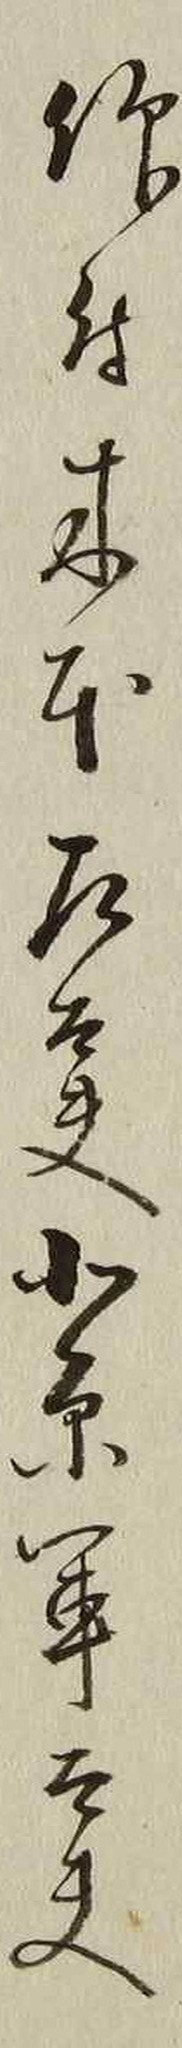仰付木本左太夫北原軍太夫
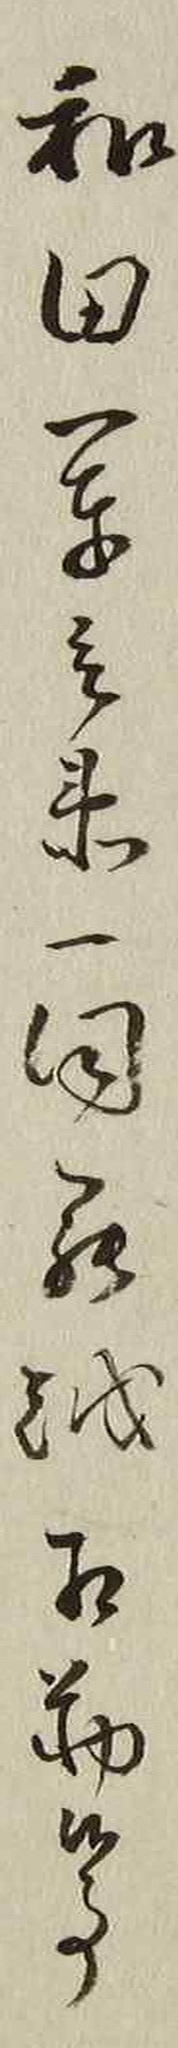和田軍兵衛一同罷越相勤候事
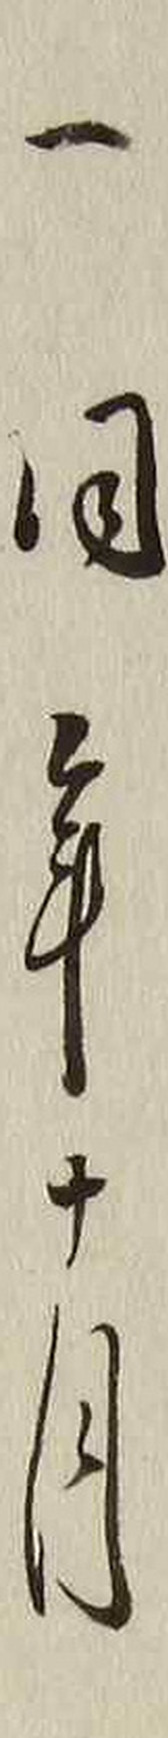一同年十月
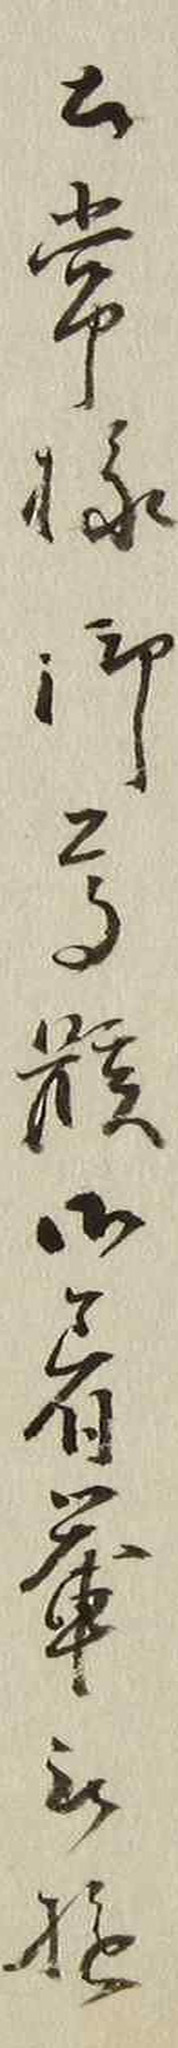土常様御尊骸御着轝被遊
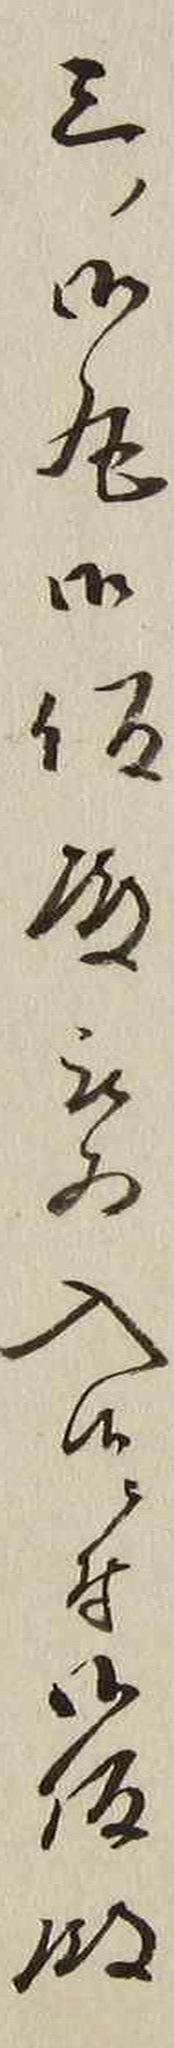三ノ御丸御仮殿被為入候に付御仮殿
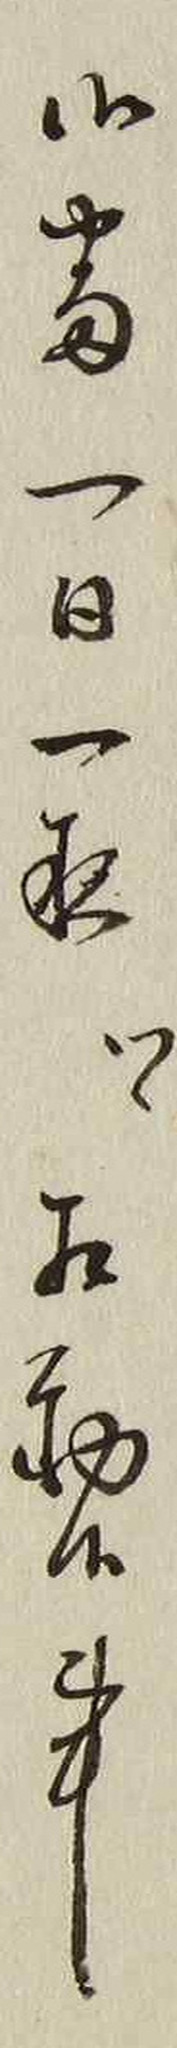御番一日一夜つヽ相勤候事
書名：諸士系譜　巻之159　な之部1
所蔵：会津若松市立会津図書館
